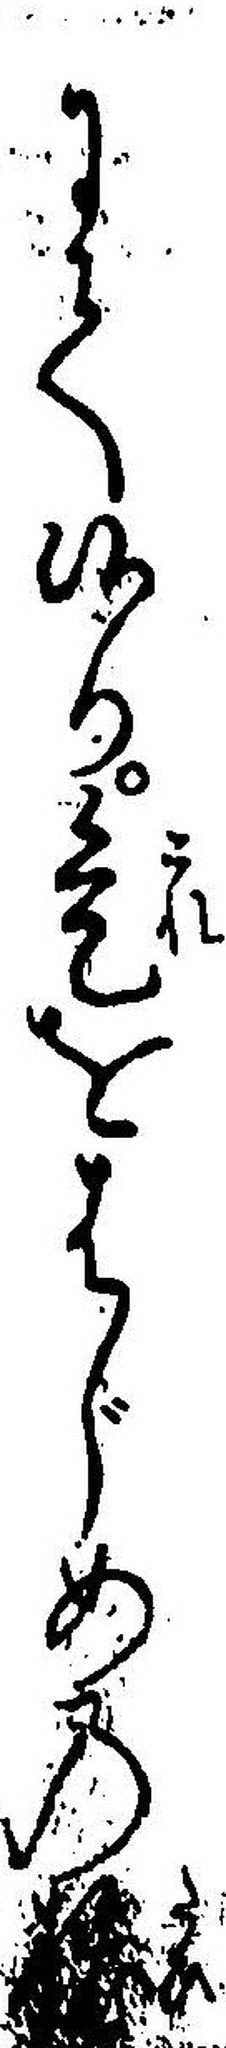にて候か。是をはじめの旅
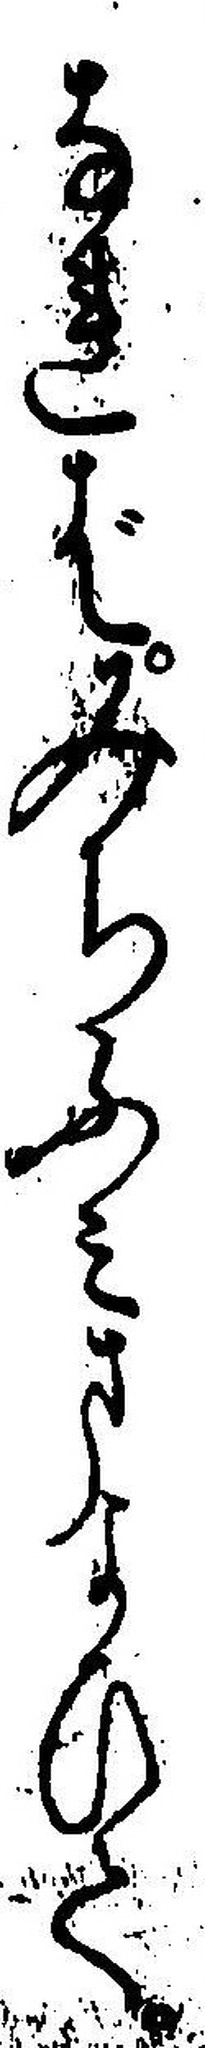なれば。みちふみまよひて
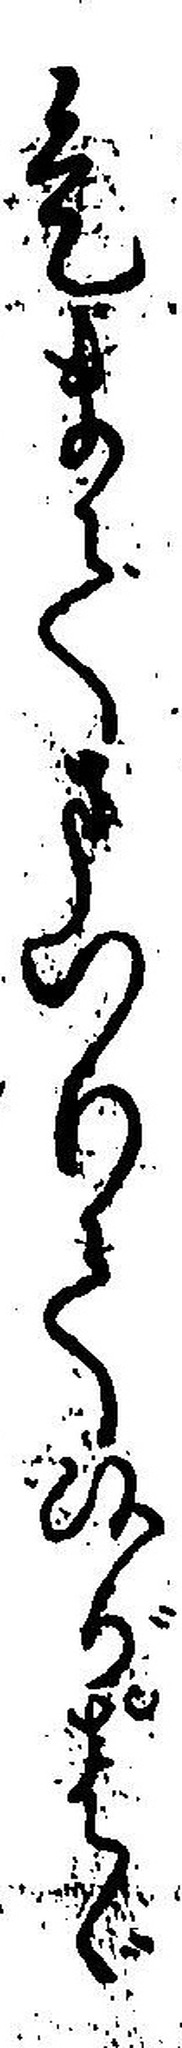是までまいりて候が。はゞ
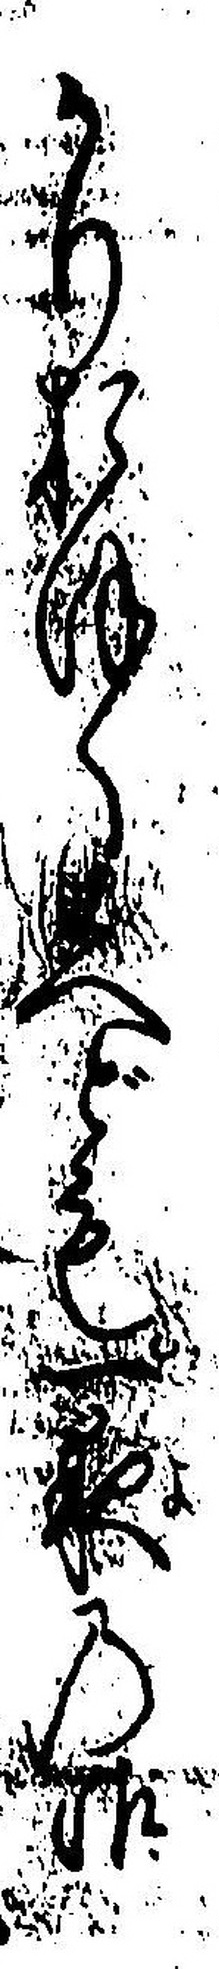かりおほく候へども一夜の御

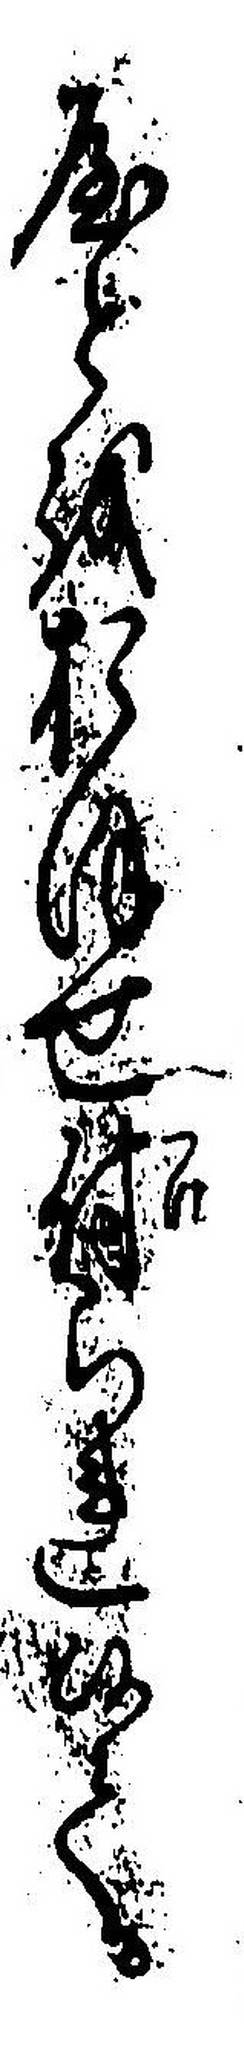やどをおほせ付られ候て。
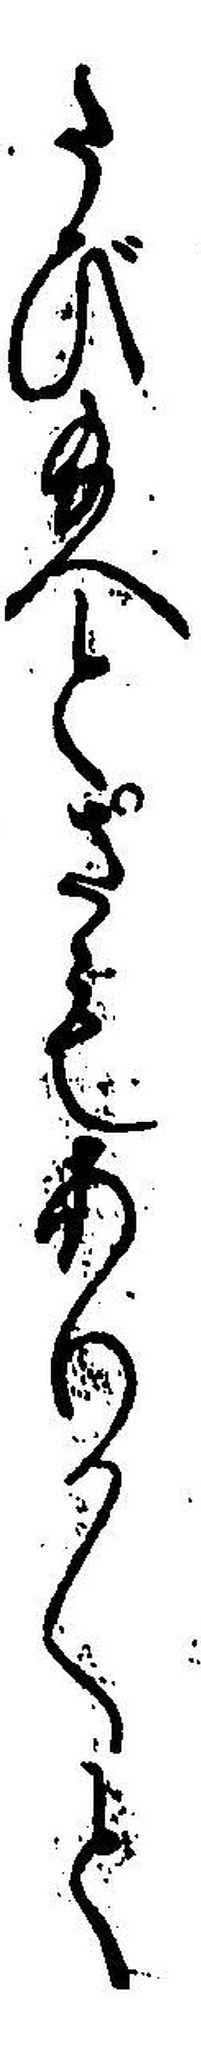たび給へと。さもあり〳〵と
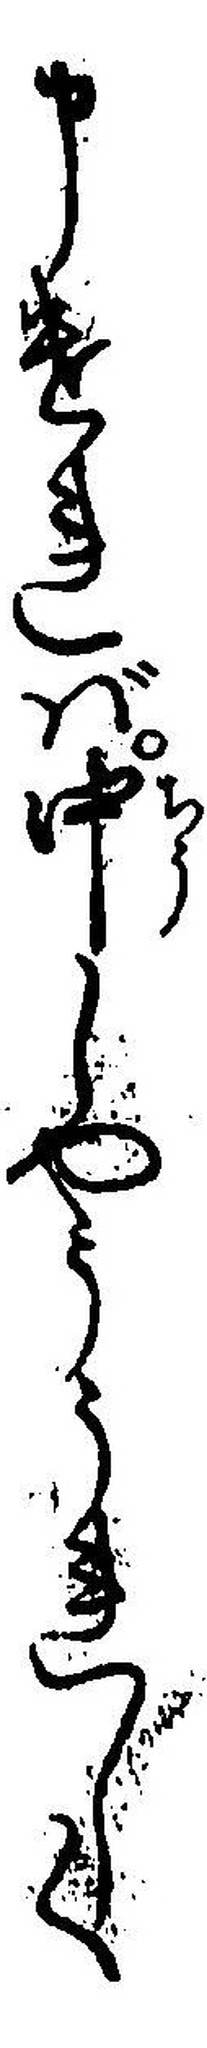申しければ。中しやうれしく
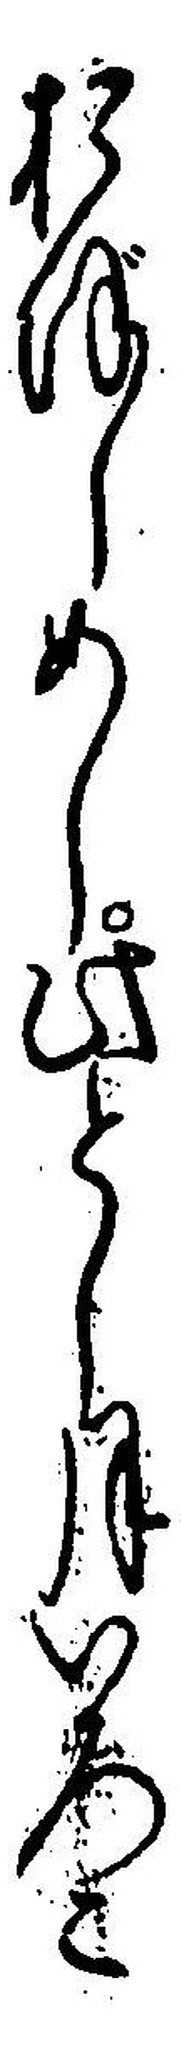おぼしめし。此とし月いろこ
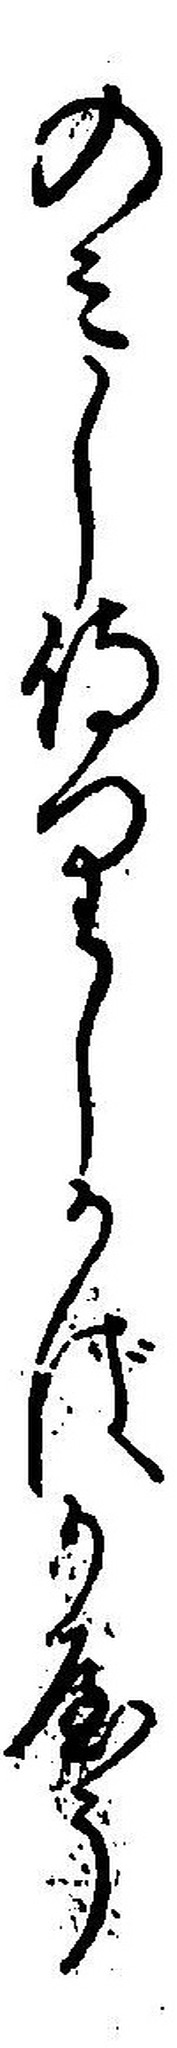のみし侍りしかばかやう
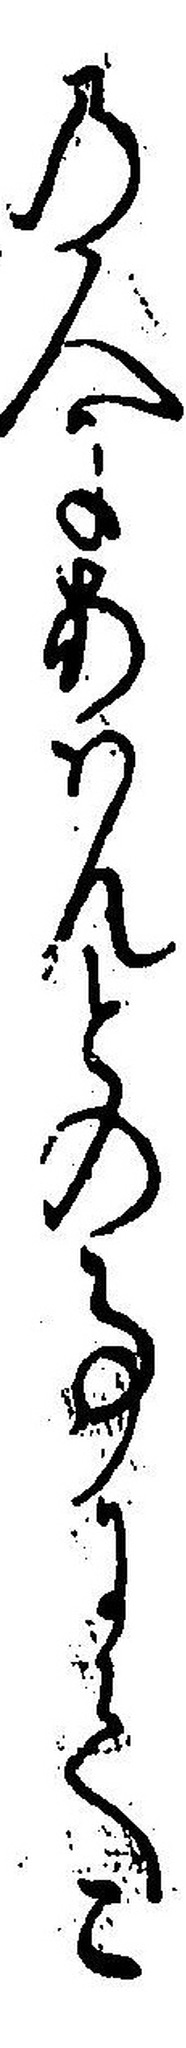の人にあはんとの事にてこ
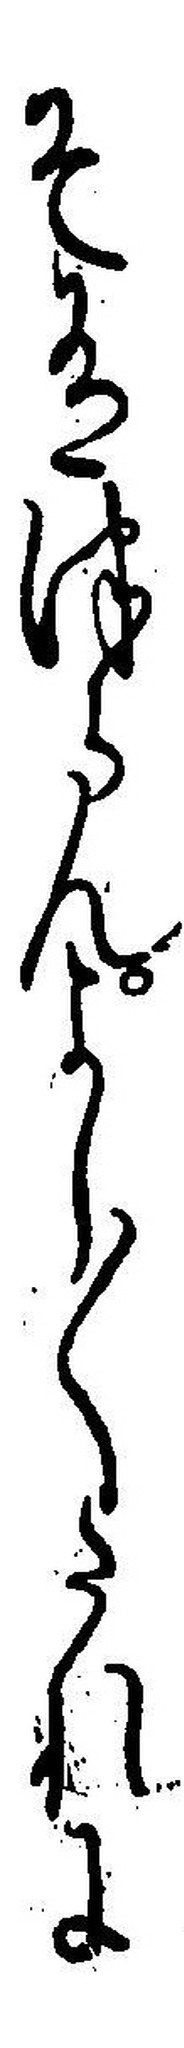そ有つらん。よし〳〵たれに
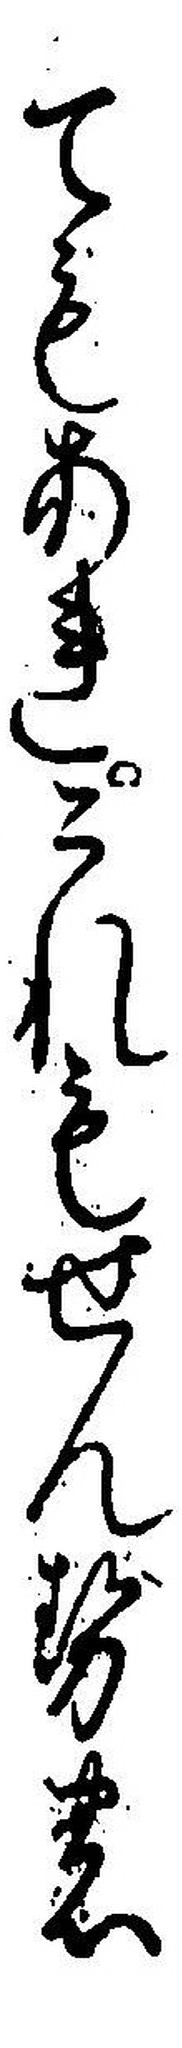てもあれ。これもせんせの
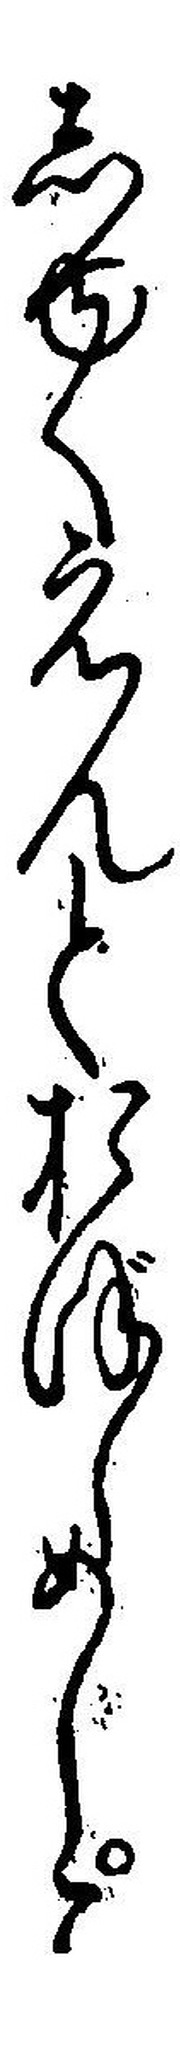しゆくえんとおぼしめし。こ
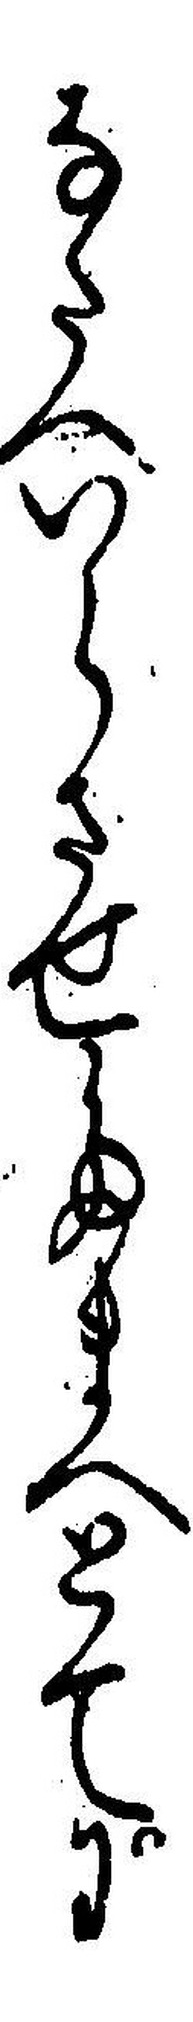なたへいらさせたまへとて。わ
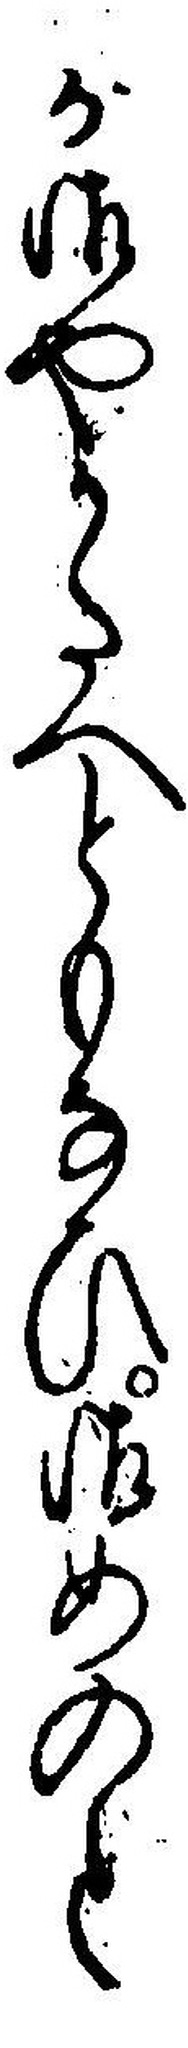が御やかたへともなひ。御めのと
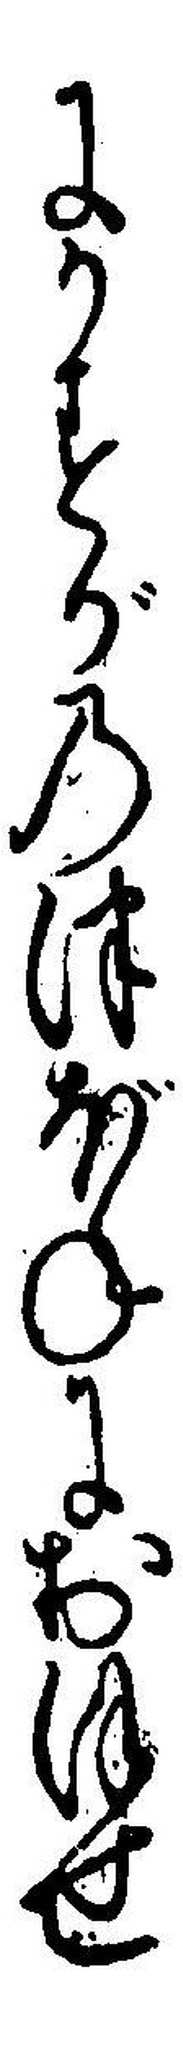にかすがのつぼねに。おほせ
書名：木幡きつね
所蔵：東京大学総合図書館 General Library in the University of Tokyo, JAPAN
